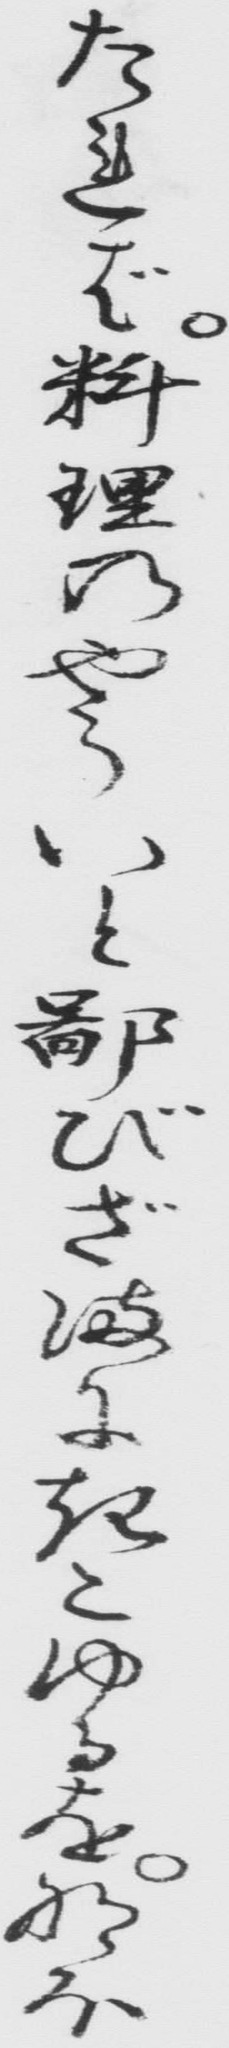たれば。料理のやういと鄙びざめにきこゆるを。なほ
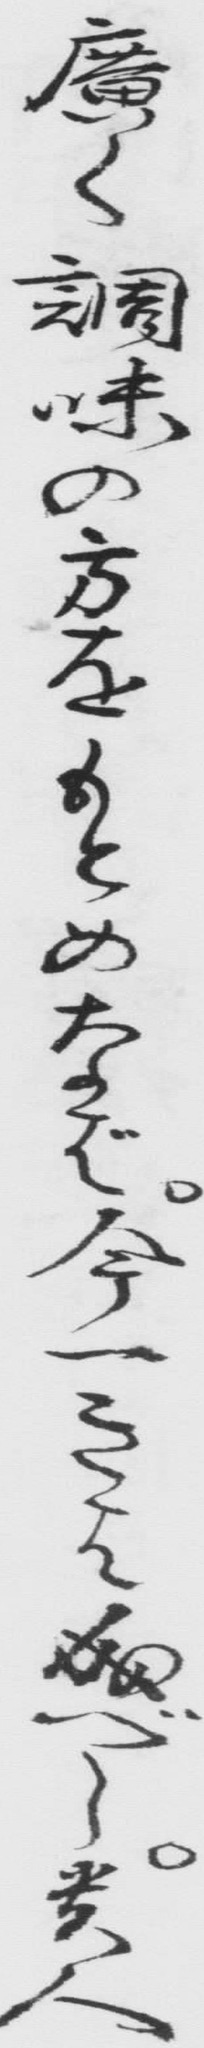広く調味の方をもとめなば。今一きは成べし。貴人

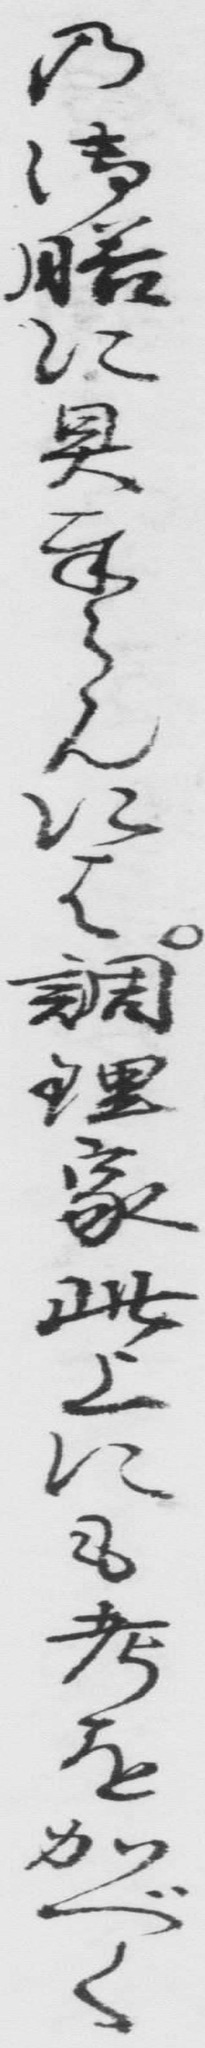の御膳に具奉らんには。調理家此上にも考を加べく
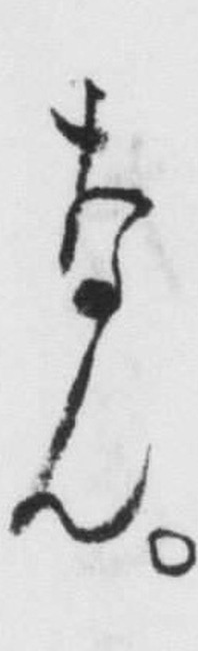なん。
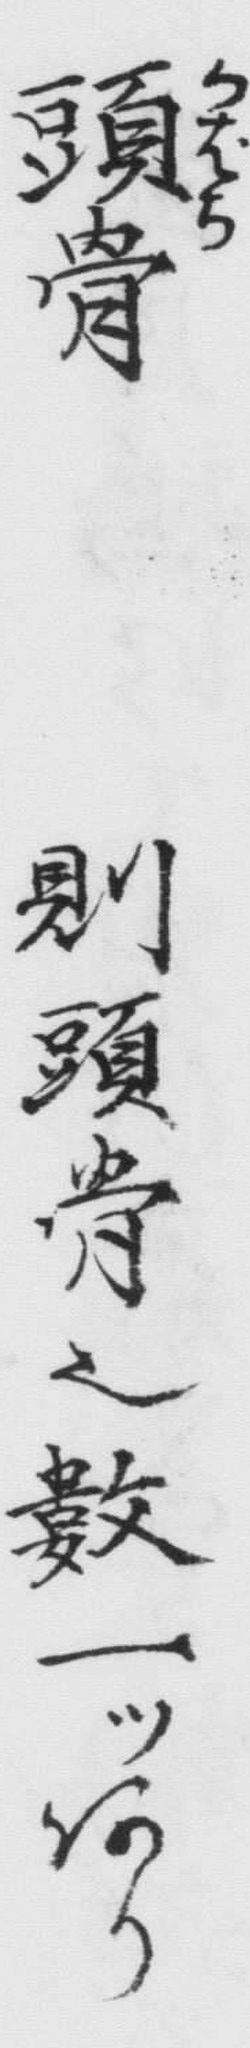頭骨則頭骨也数一ツあり
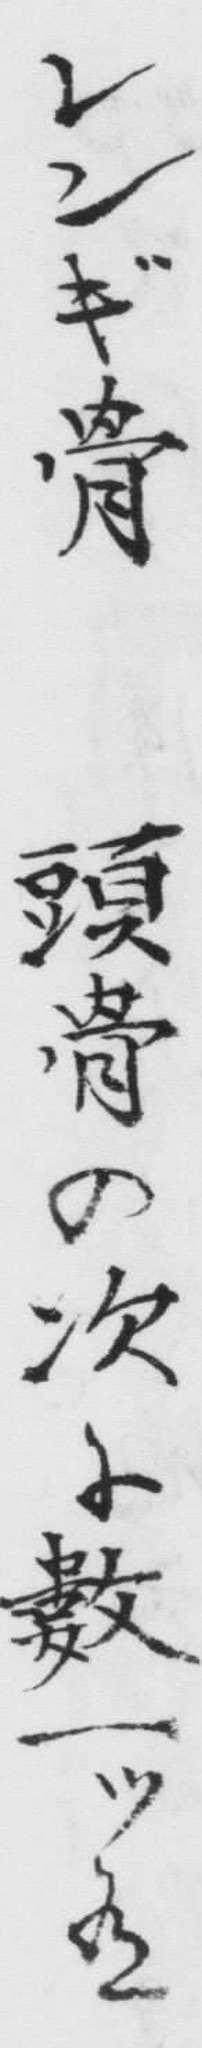レンギ骨頭骨の次に数一ツ有
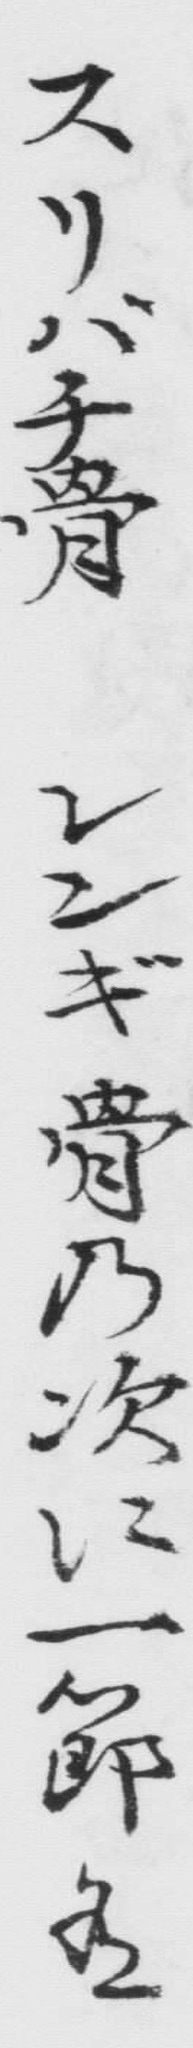スリバチ骨レンギ骨の次に一節有
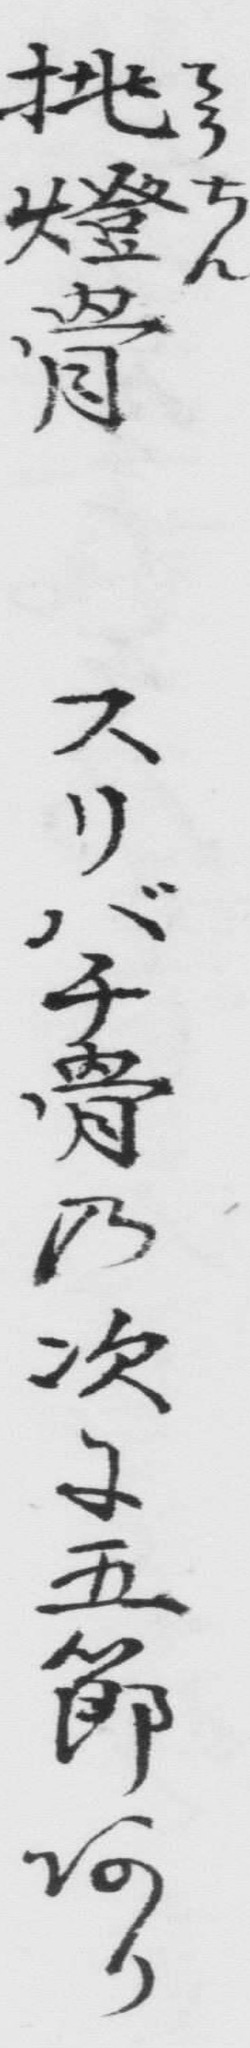挑燈骨スリバチ骨の次に五節あり
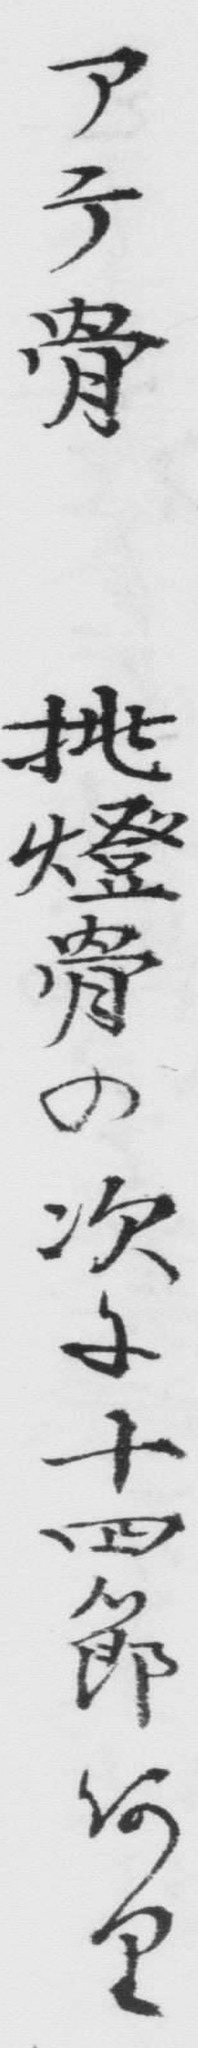アテ骨挑燈骨の次に十四節あり
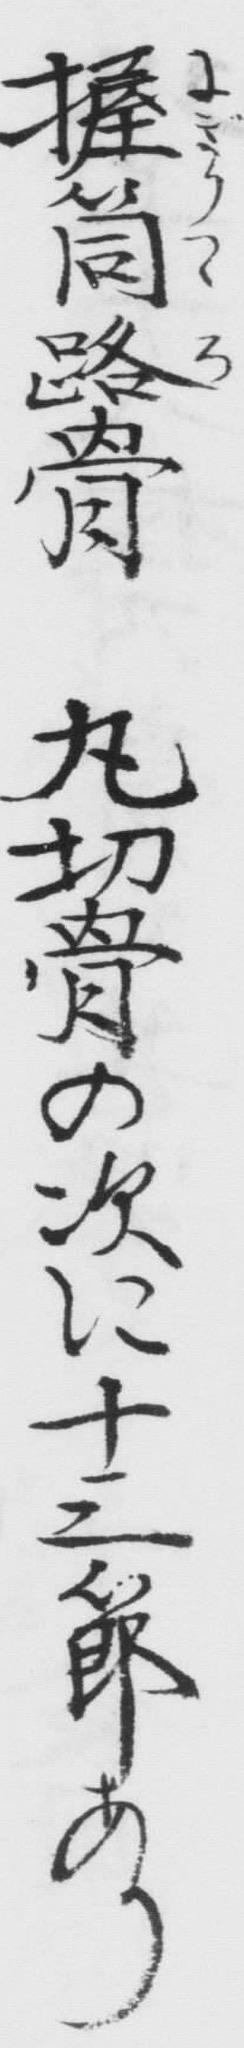握筒路骨丸切骨の次に十三節あり
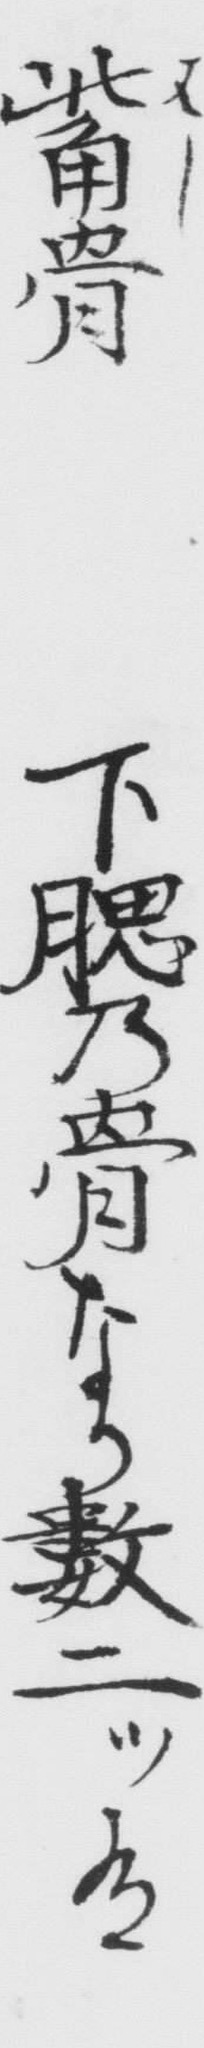觜骨下腮の骨なり数二ツ有
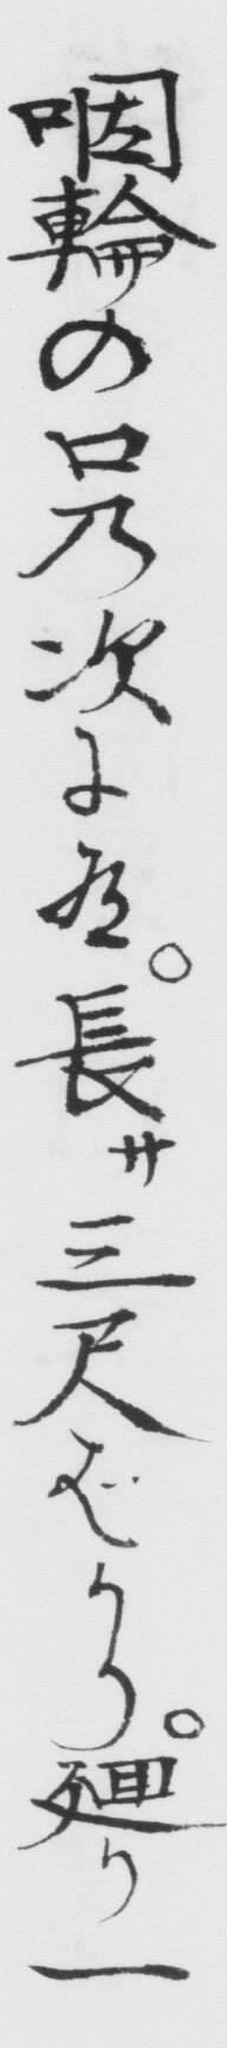胸骨咽輪の口の次に有。長サ三尺ばかり。廻り一
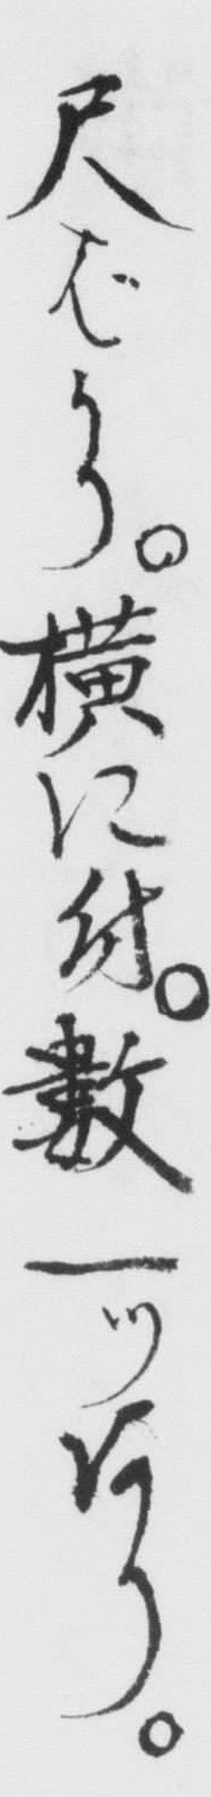尺ばかり。横に付。数一ツあり。
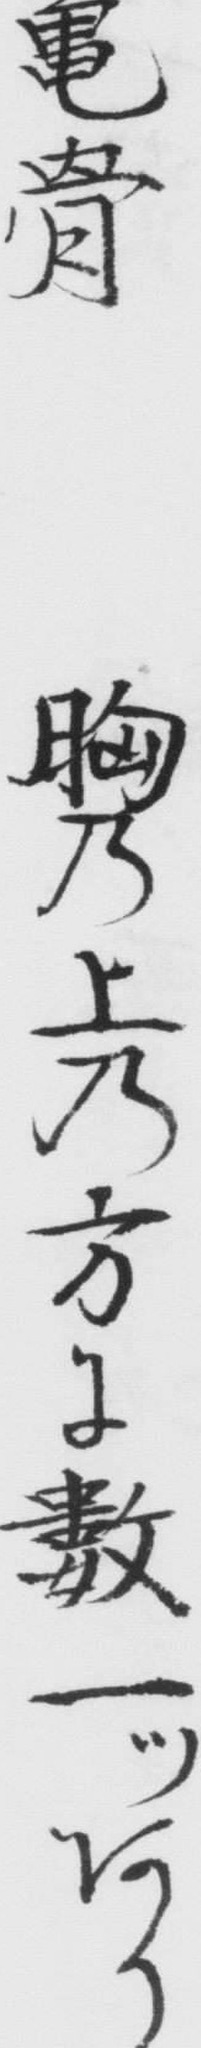亀骨胸の上の方に数一ツあり
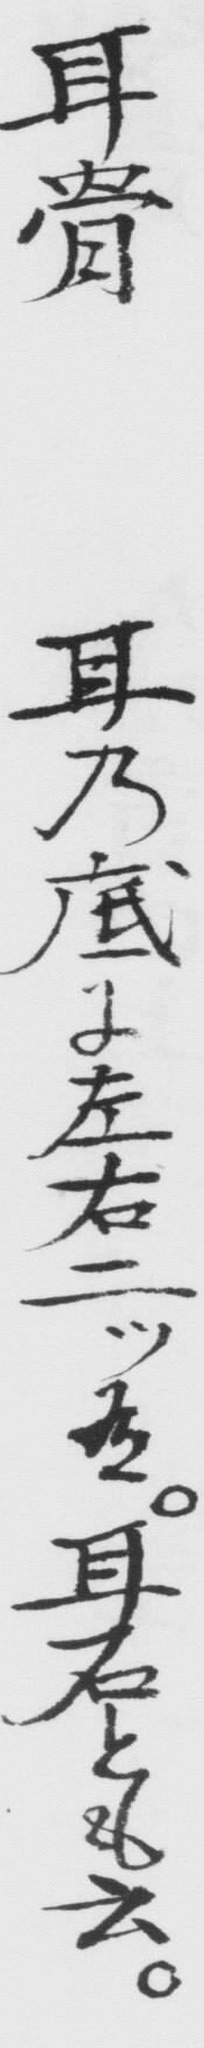耳骨耳の底に左右二ツ有。耳石とも云。
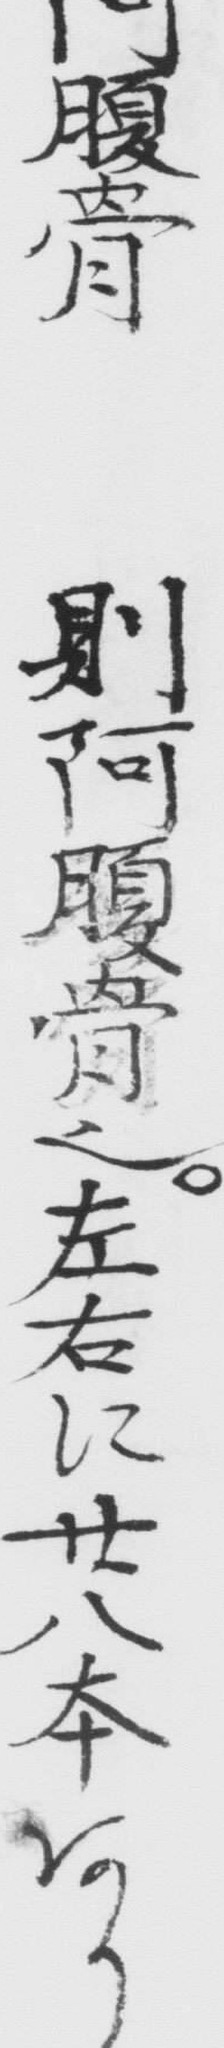阿腹骨則阿腹骨也。左右に廿八本あり
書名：鯨肉調味方
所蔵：大阪府立大学学術情報センター 国文学研究資料館
